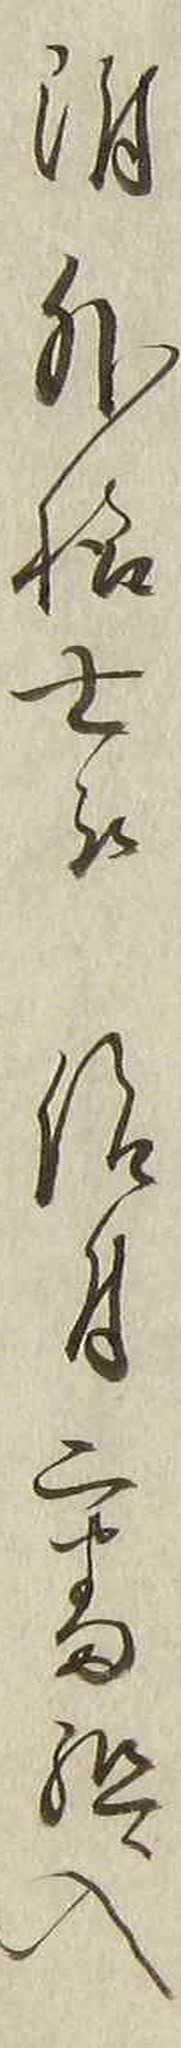附外様士被仰付二番組へ入

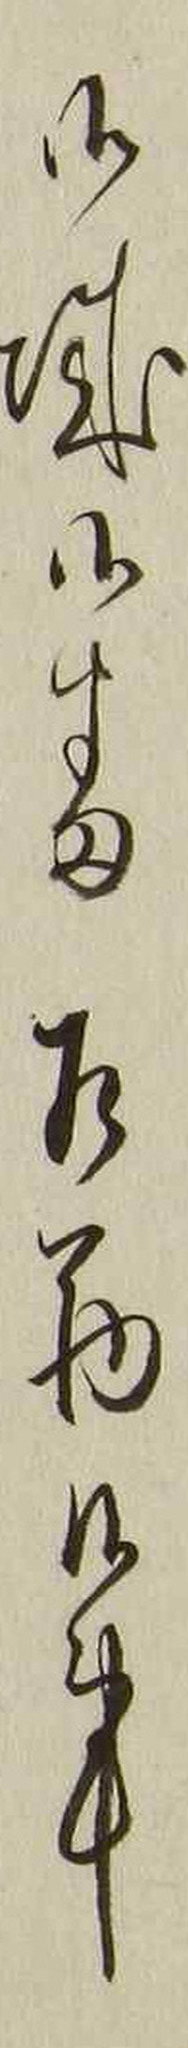御城御番相勤候事
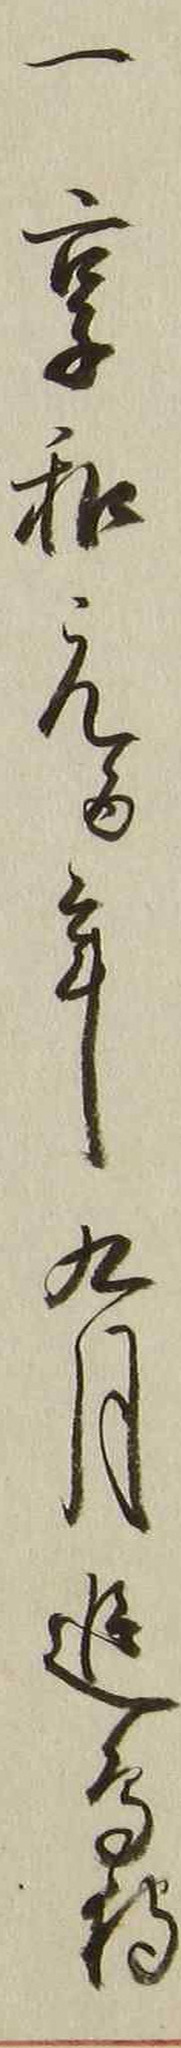一享和元酉年九月追鳥狩
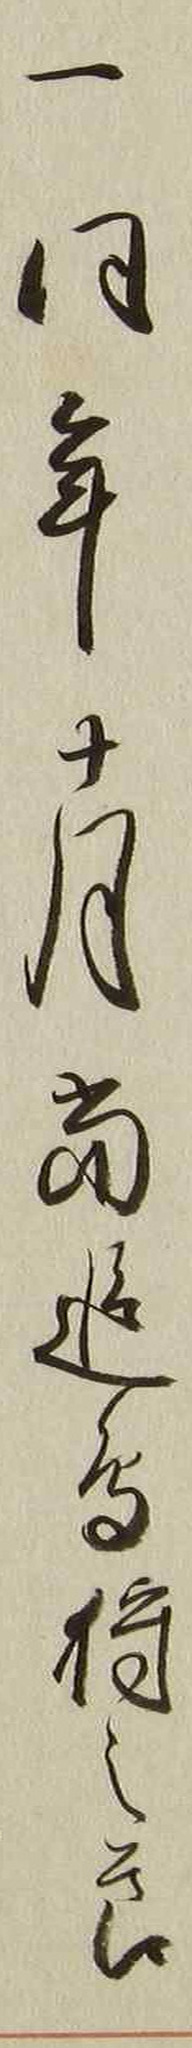一同年十月当追鳥狩之節
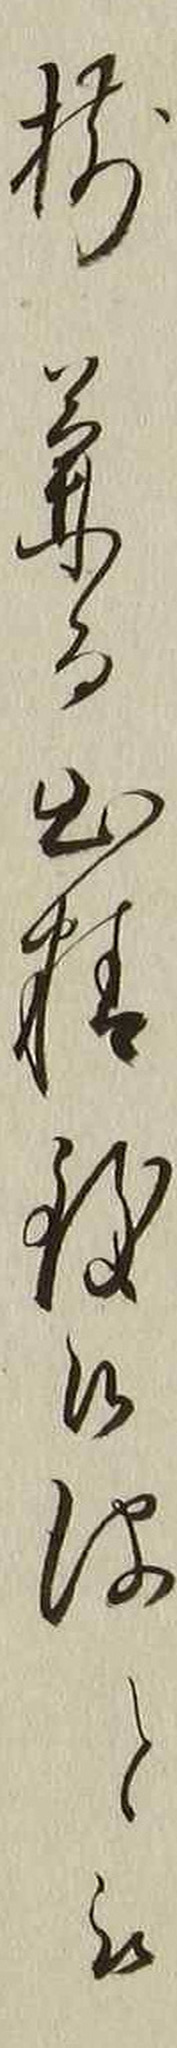揃兼而出精致候儀と被
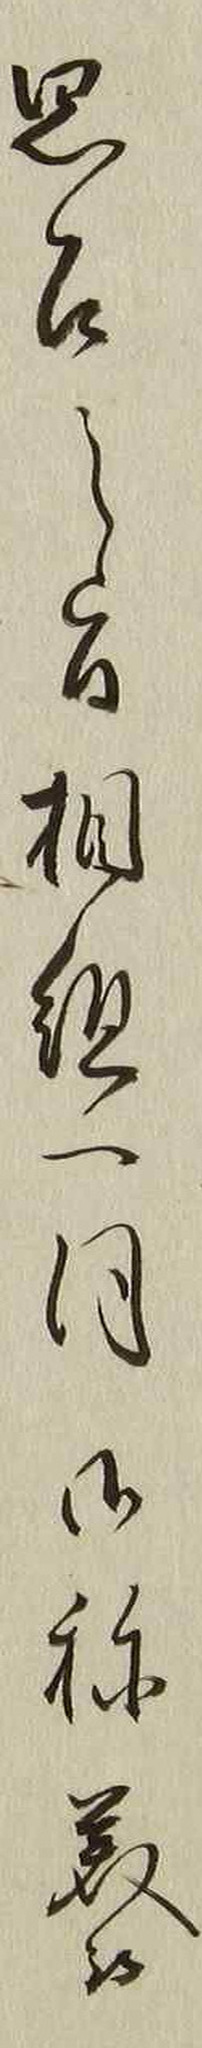思召之旨相組一同御称美被
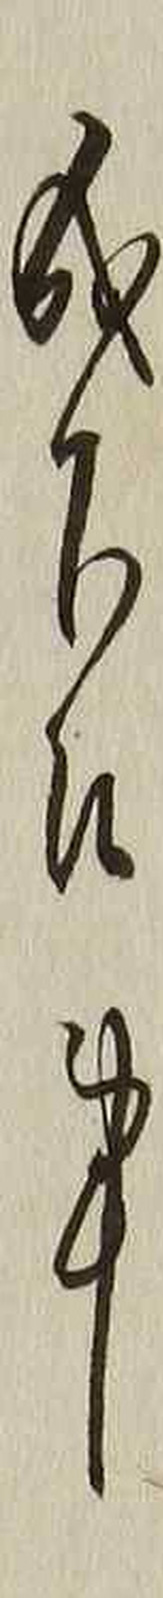成下候事
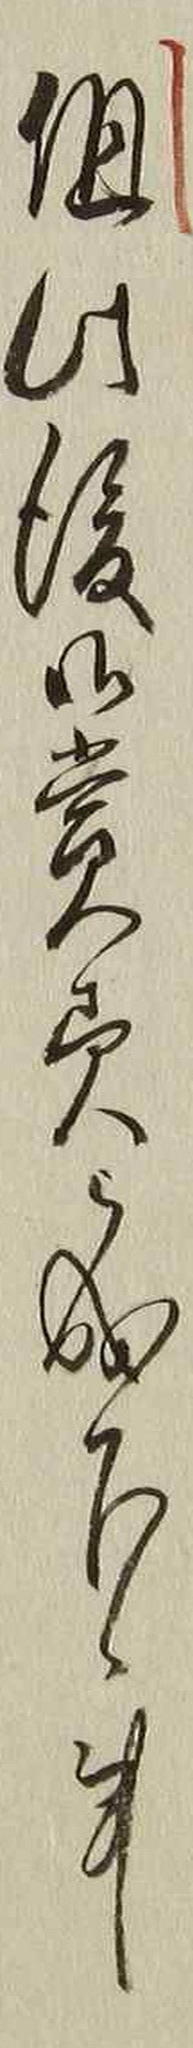但此後御賞美被成下候事
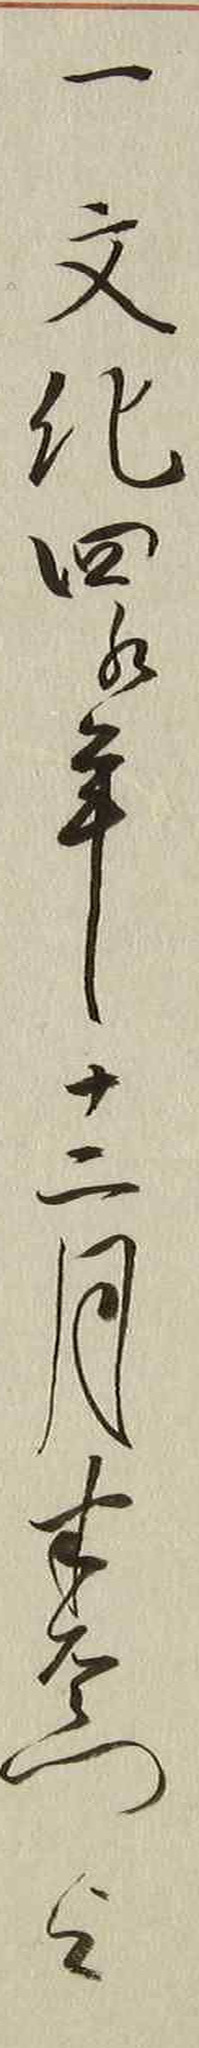一文化四卯年十二月半右衛門と
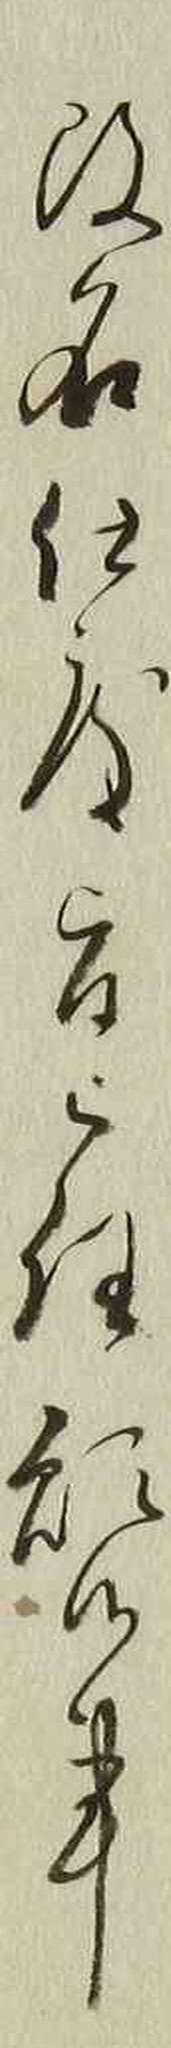改名仕度旨被任願候事
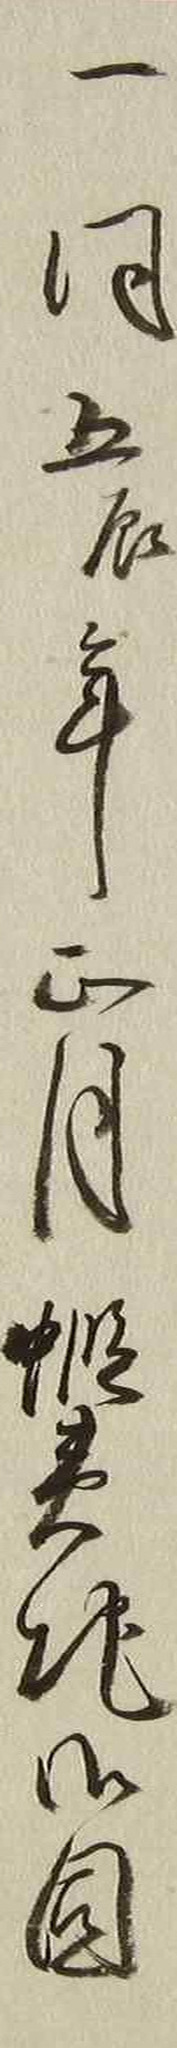一同五辰年正月蝦夷地御固
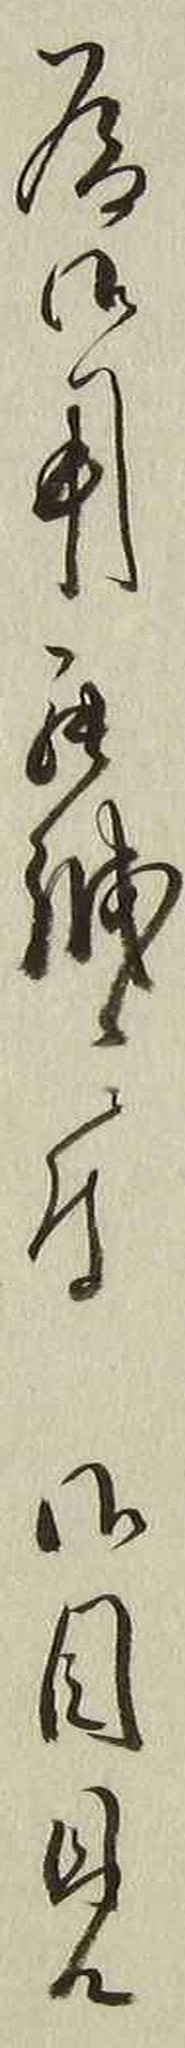為御用罷越候ニ付御目見
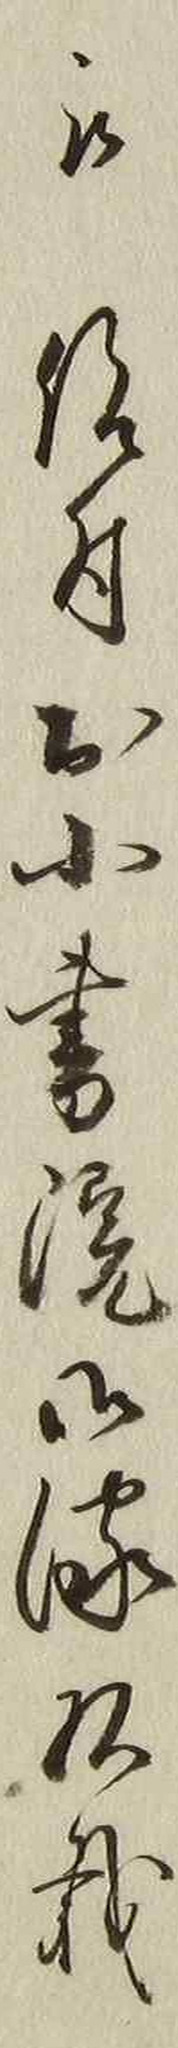被仰付候於小書院御流頂戴
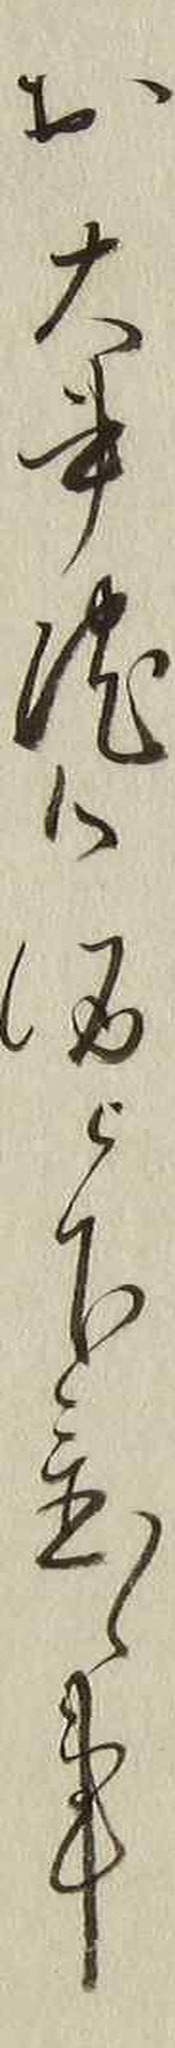於大書院御酒被下置候事
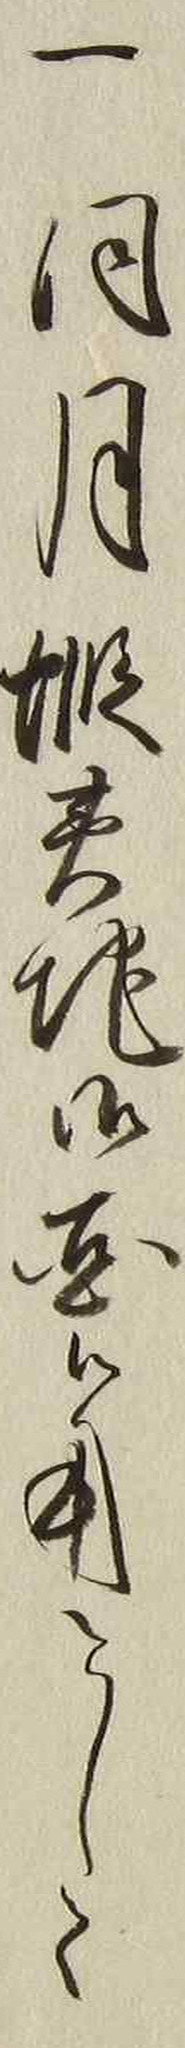一同月蝦夷地御固御用として
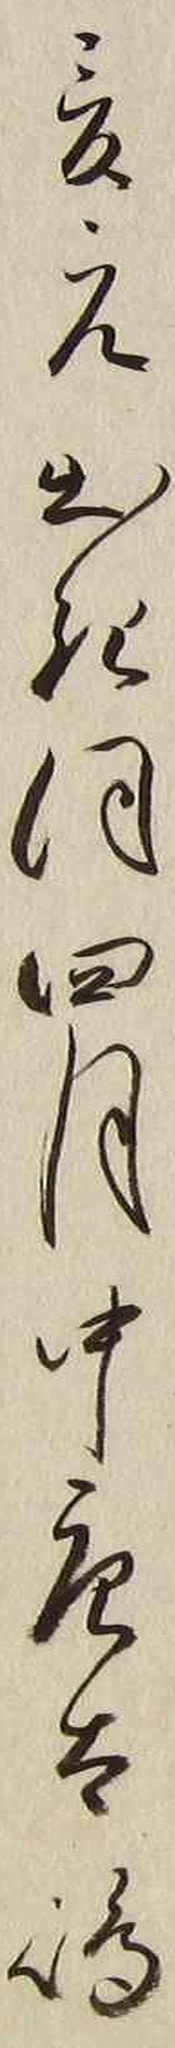爰元出張同四月中唐太嶋
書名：諸士系譜　巻之18　い之部18
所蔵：会津若松市立会津図書館
